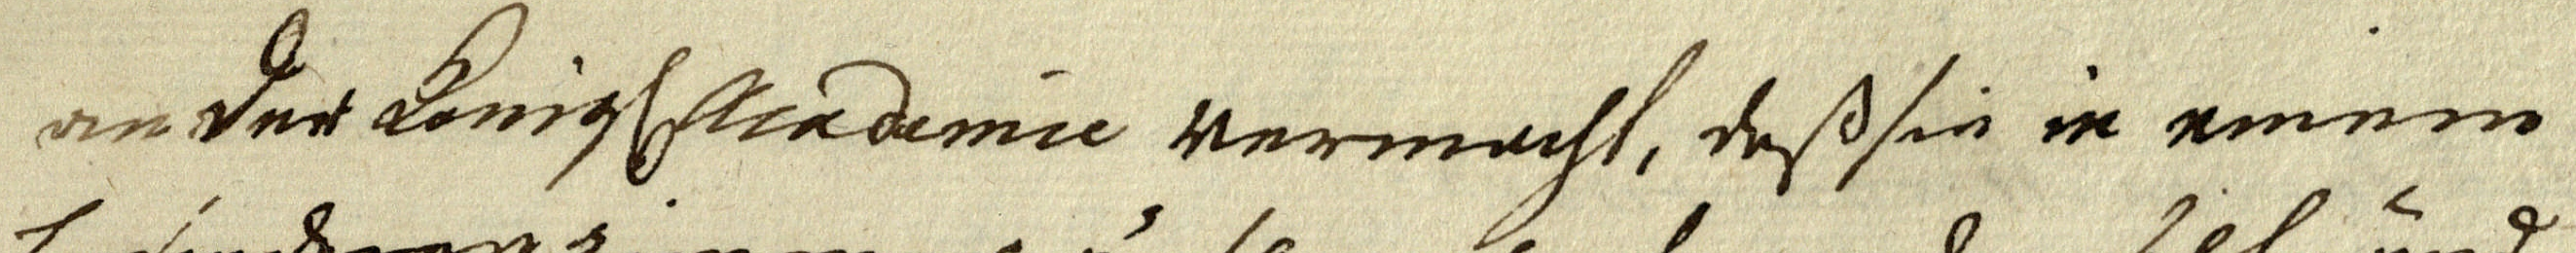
an der Königl. Academie vermacht, daß sie in einem
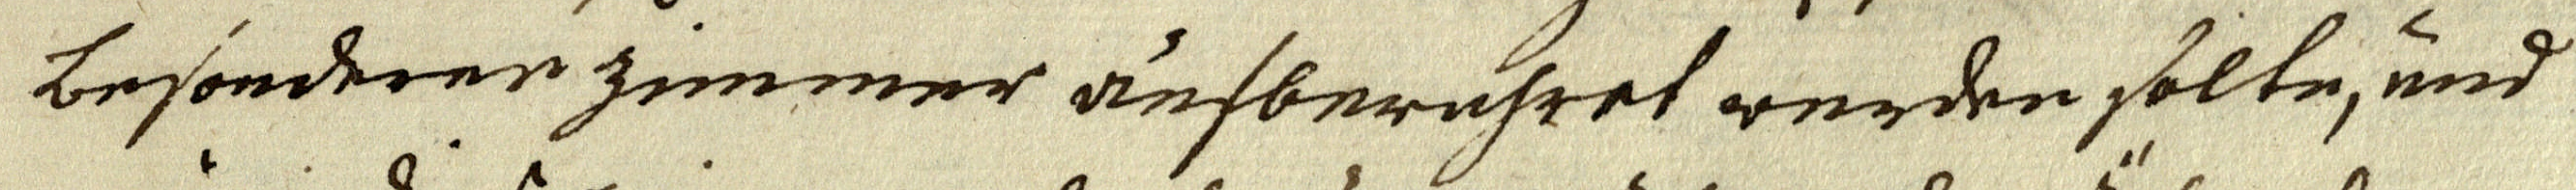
besonderen Zimmer aufbewahret werden solte, und
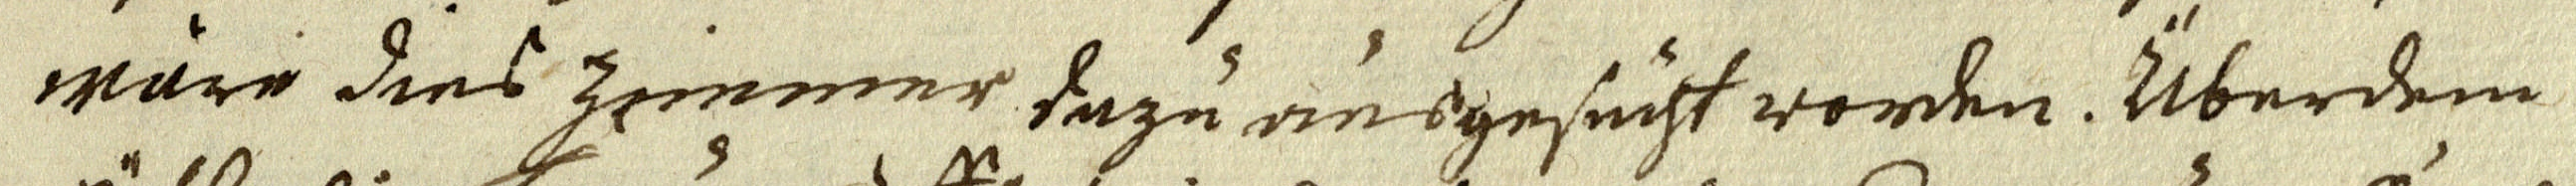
wäre dies Zimmer dazu ausgesucht worden. Überdem
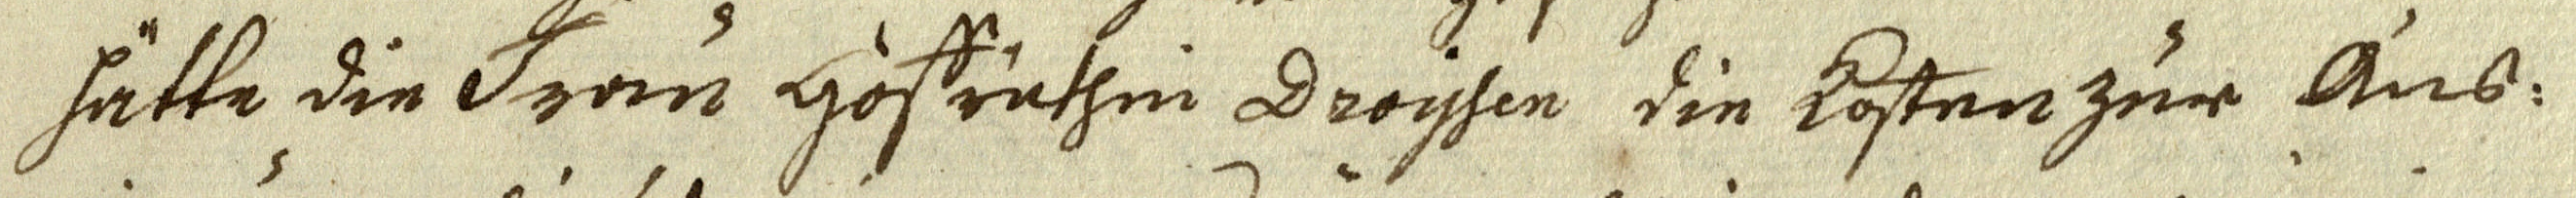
hätte die Frau Hofräthin Droÿsen die Kosten zur Aus¬
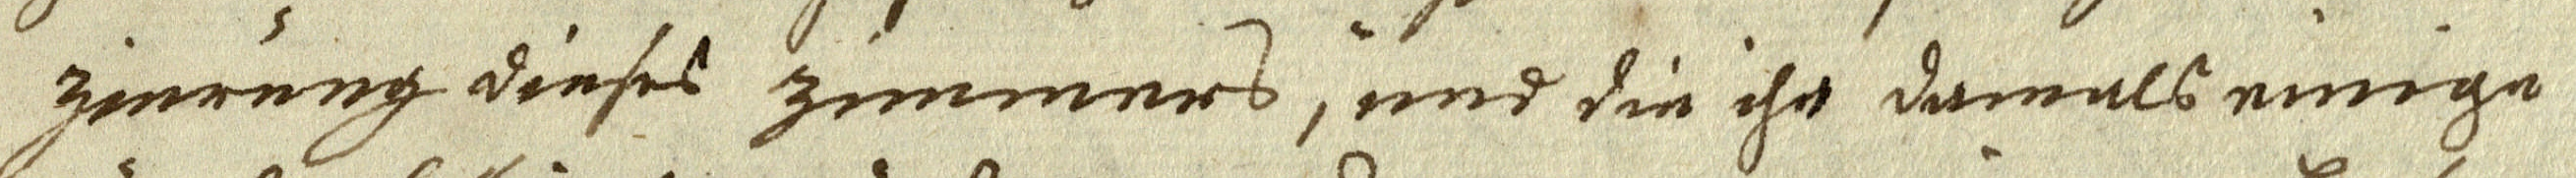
zierung dieses Zimmers, und die ihr damals einige
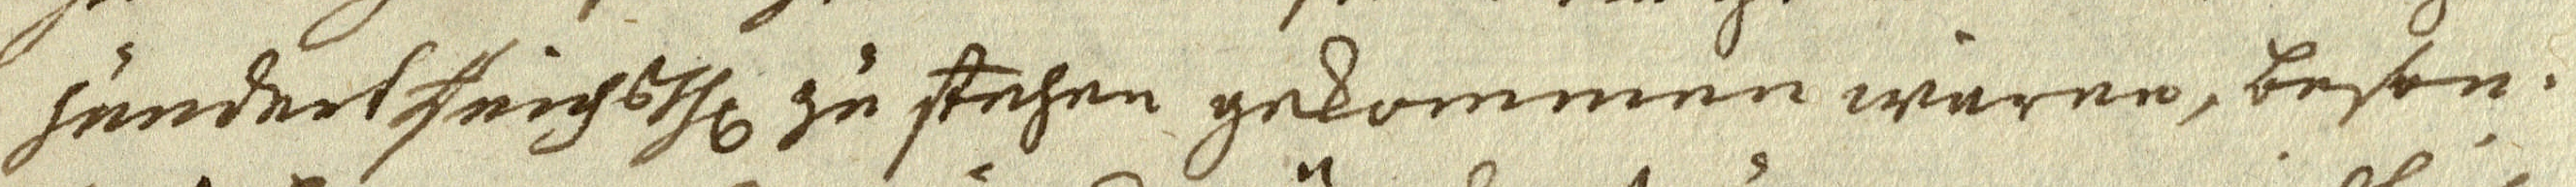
hundert Reichst. zustehen gekommen wären, beson¬
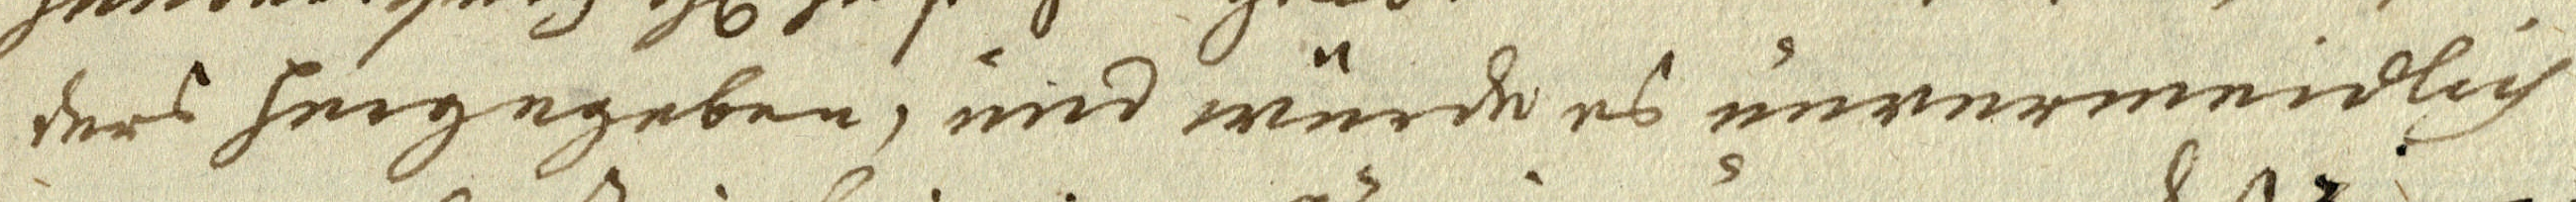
ders hergegeben, und würde es unvermeidlich
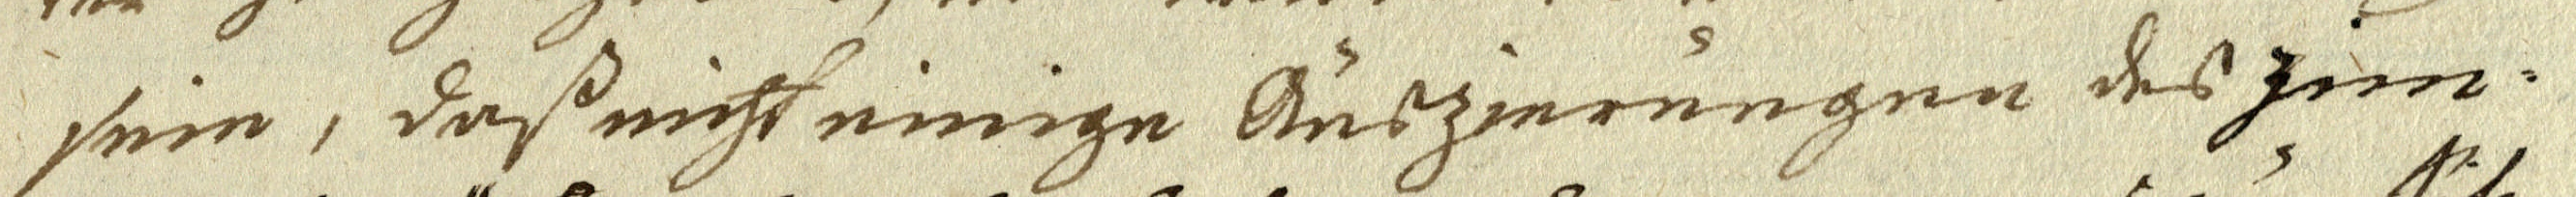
sein, daß nicht einige Auszierungen des Zim¬
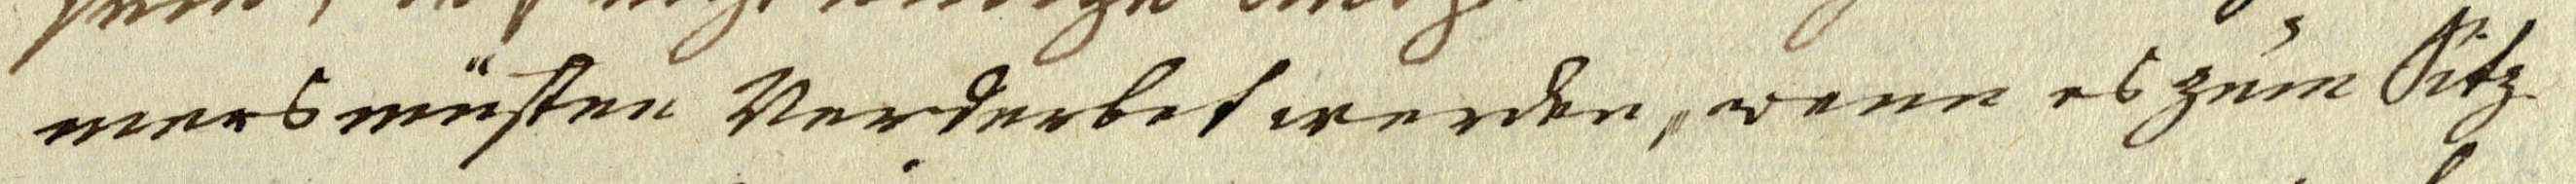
mers müsten verderbet werden, wenn es zum Sitz
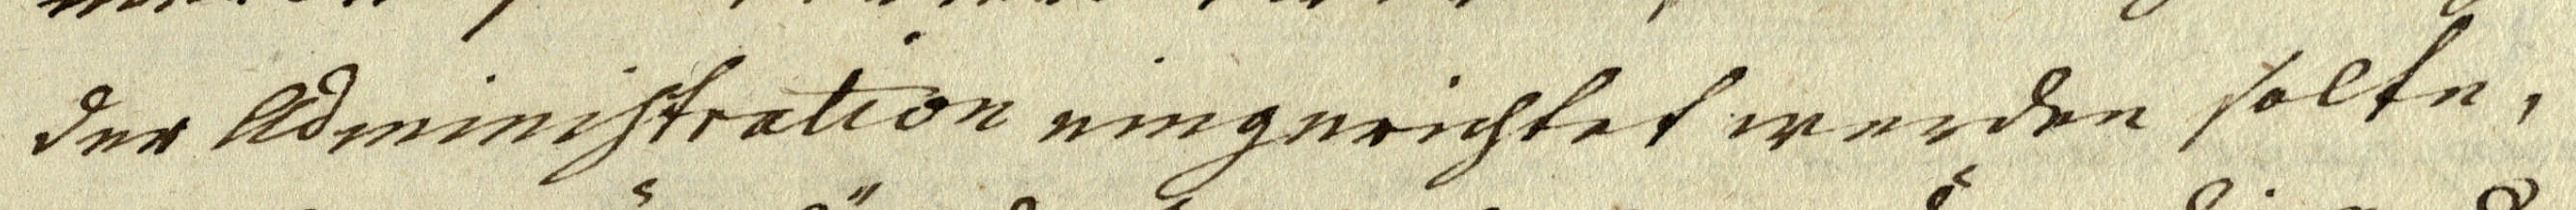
der Administration eingerichtet werden solte,
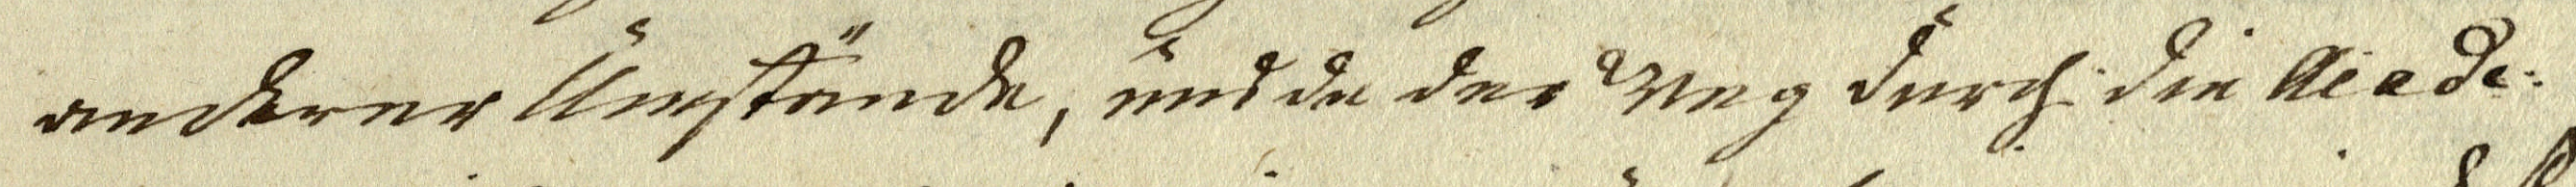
anderer Umstände, und da der Weg durch die Acade¬
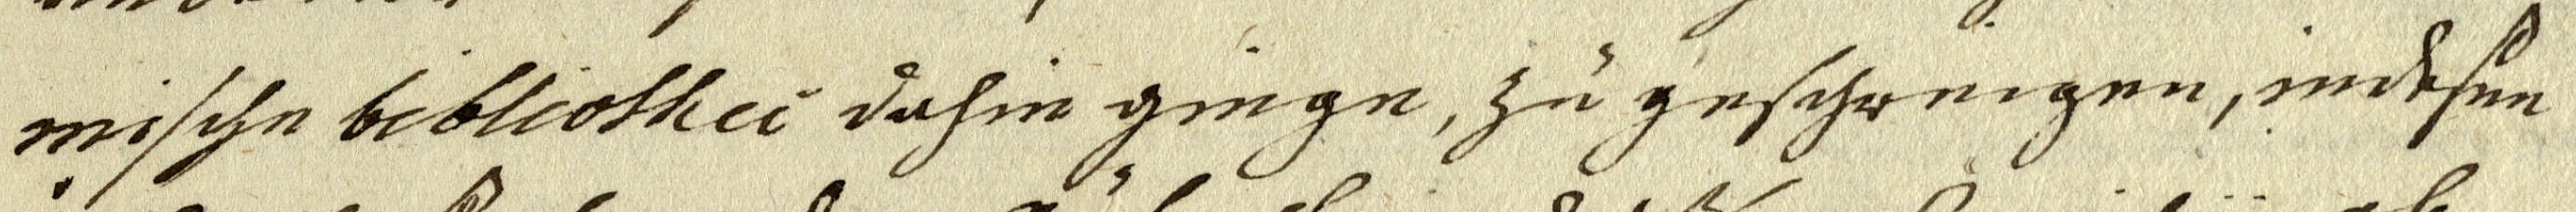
mische Bibliothec dahin ginge, zu geschweigen, indeßen
